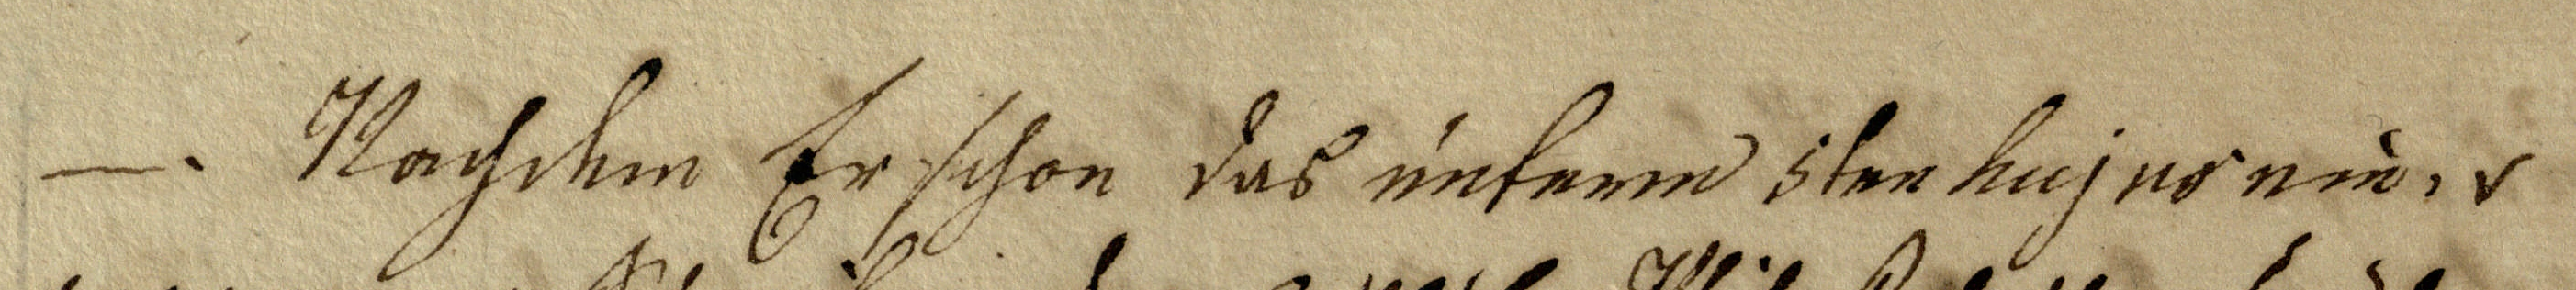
Nachdem Er schon das unterm 5 ten hujus ein¬
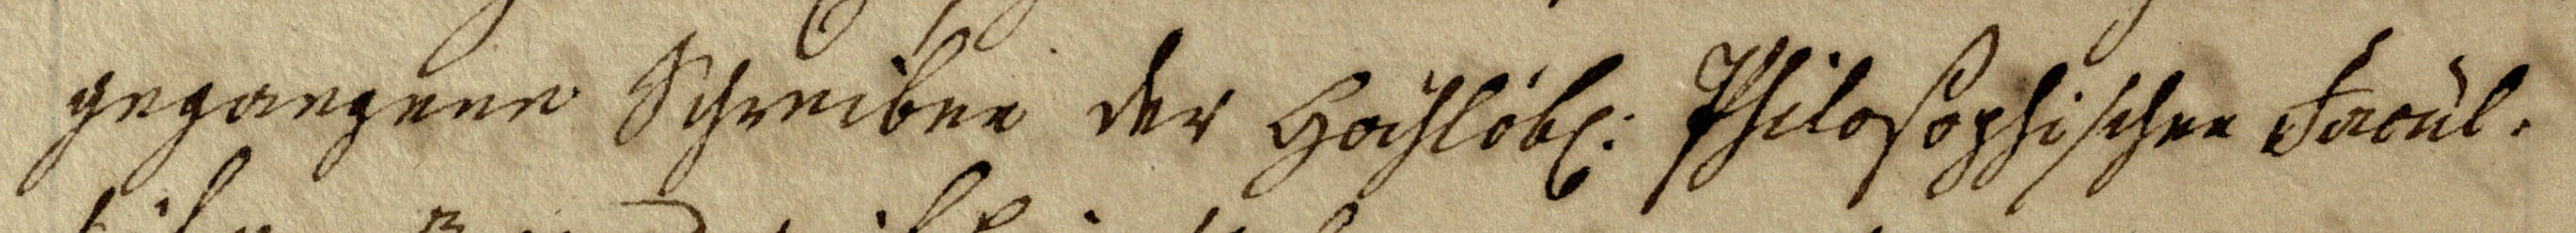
gegangene Schreiben der Hochlöbl. Philosophischen Facul¬
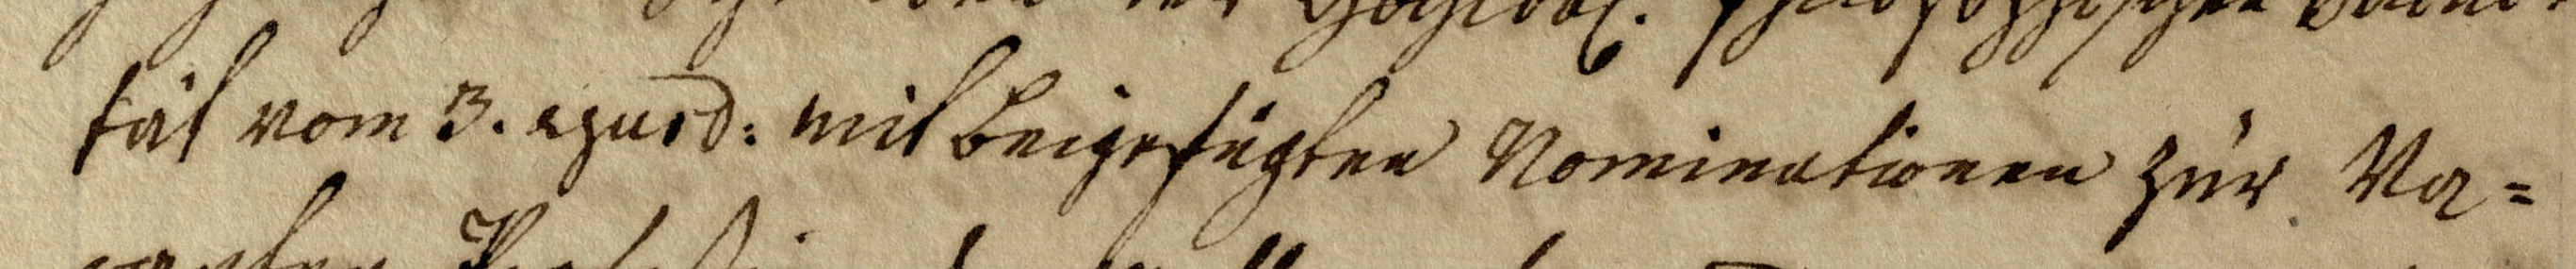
tät vom 3. ejusd. mit beigefügten Nominationen zur va¬
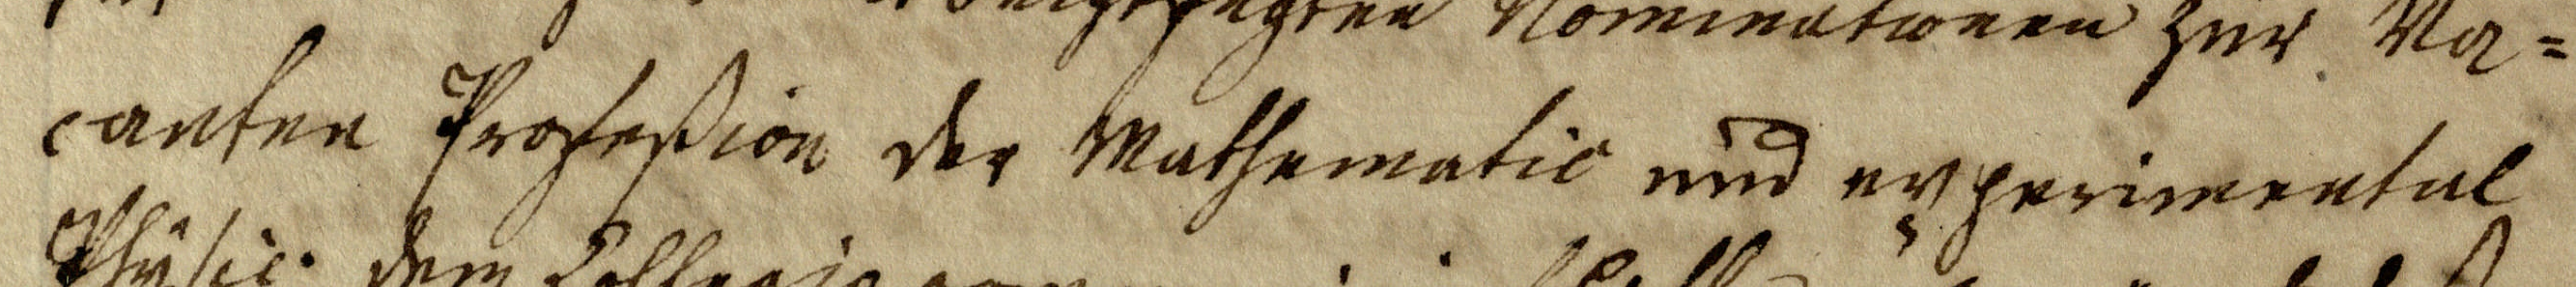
canten Profeßion der Mathematic und experimental
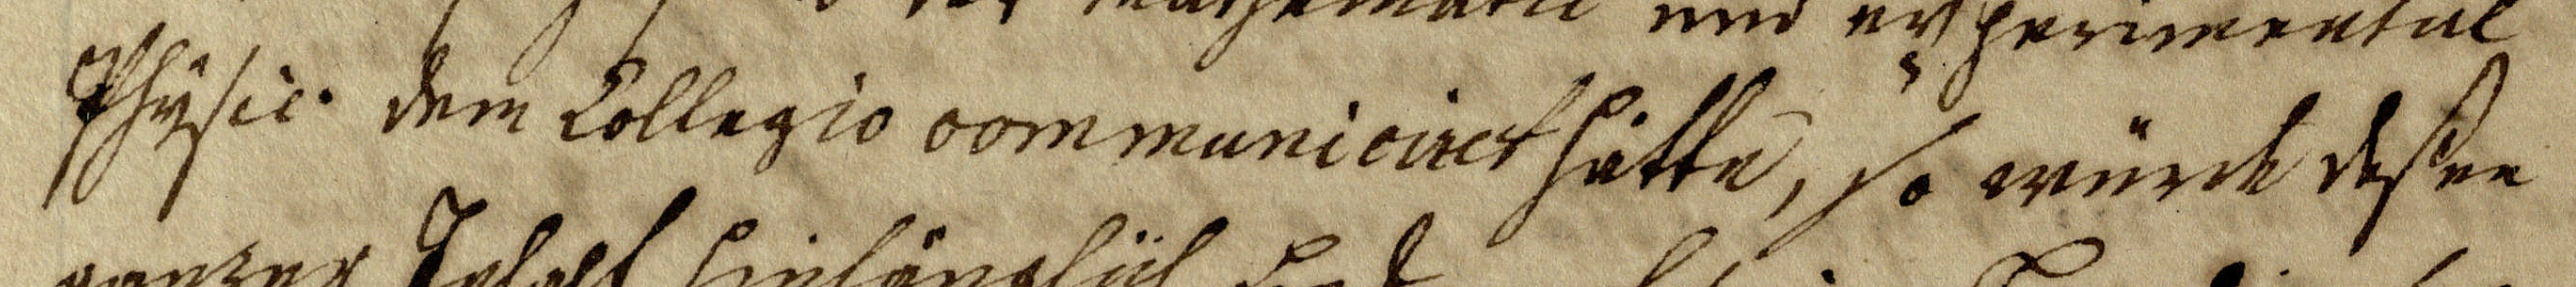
Phÿsic dem Collegio communiciret hätte, so würde deßen
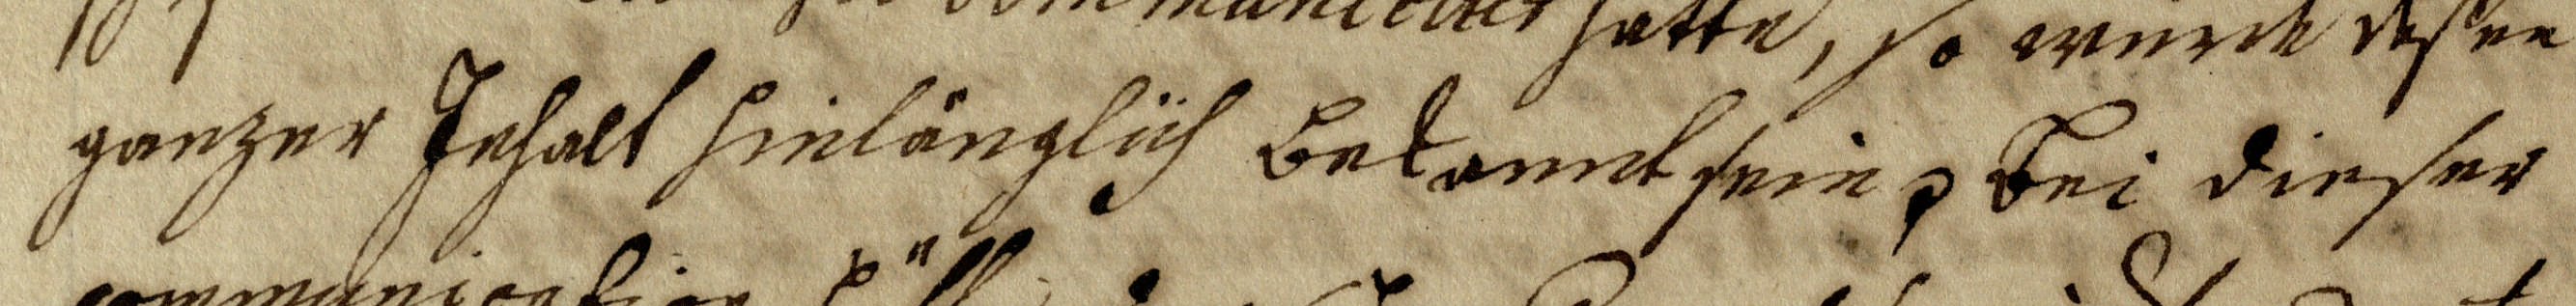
ganzer Inhalt hinlänglich bekannt sein. Bei dieser
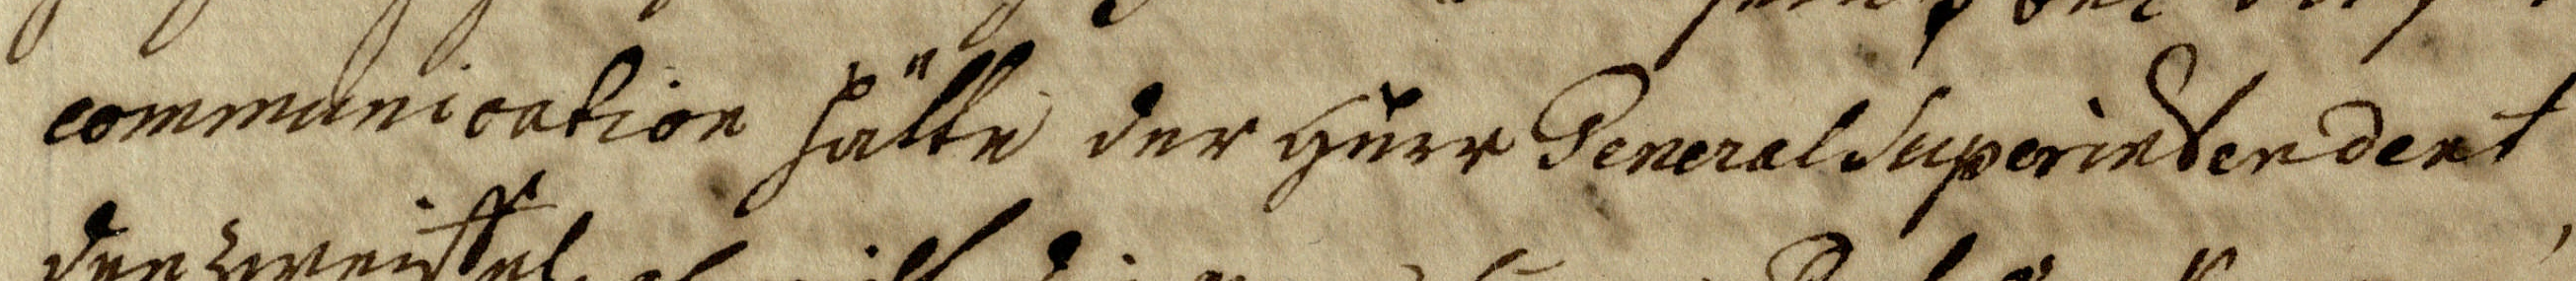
communication hätte der Herr General Superintendent
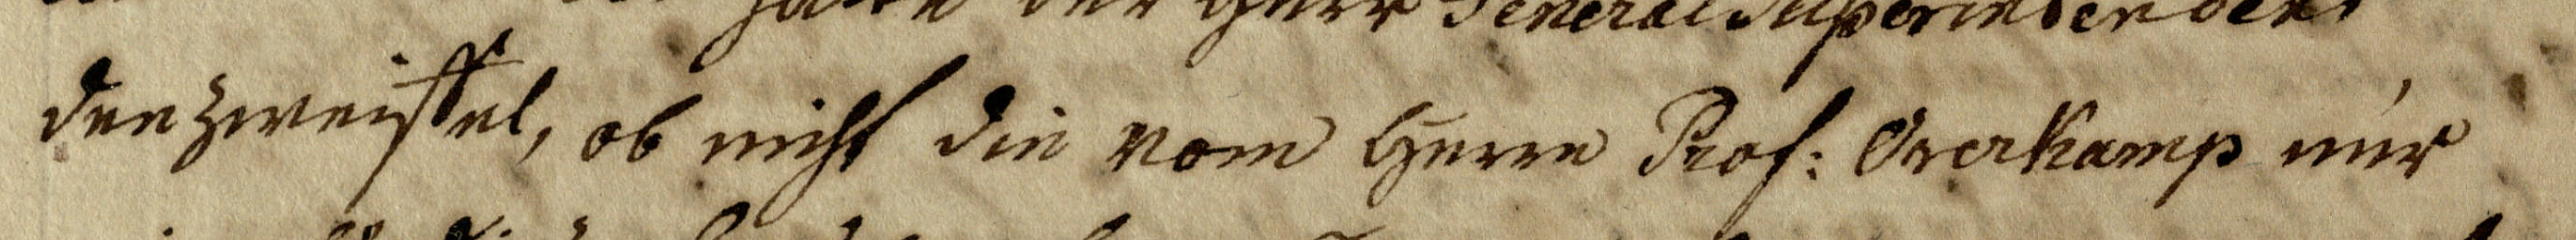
den Zweifel, ob nicht die vom Herrn Prof. Overkamp nur
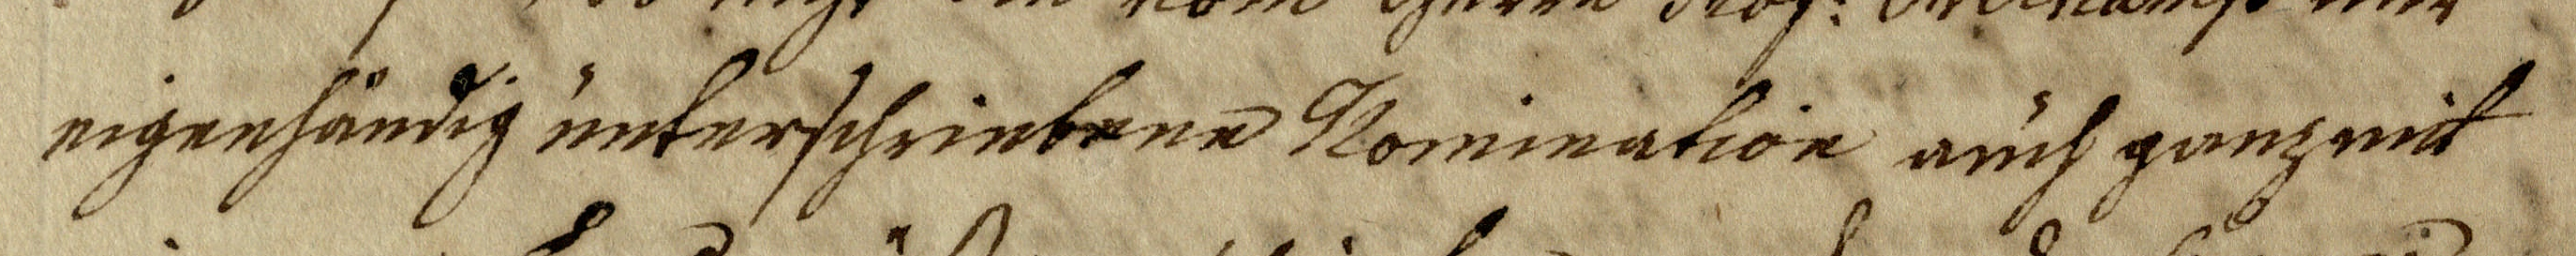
eigenhändig unterschriebene Nomination auch ganz mit
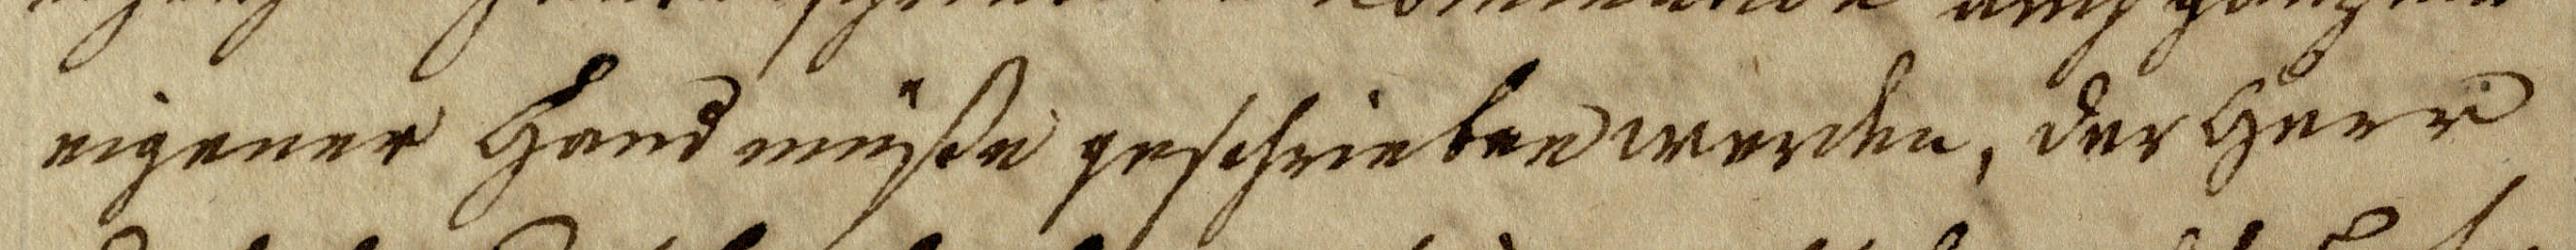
eigener Hand müße geschrieben werden, der Herrn
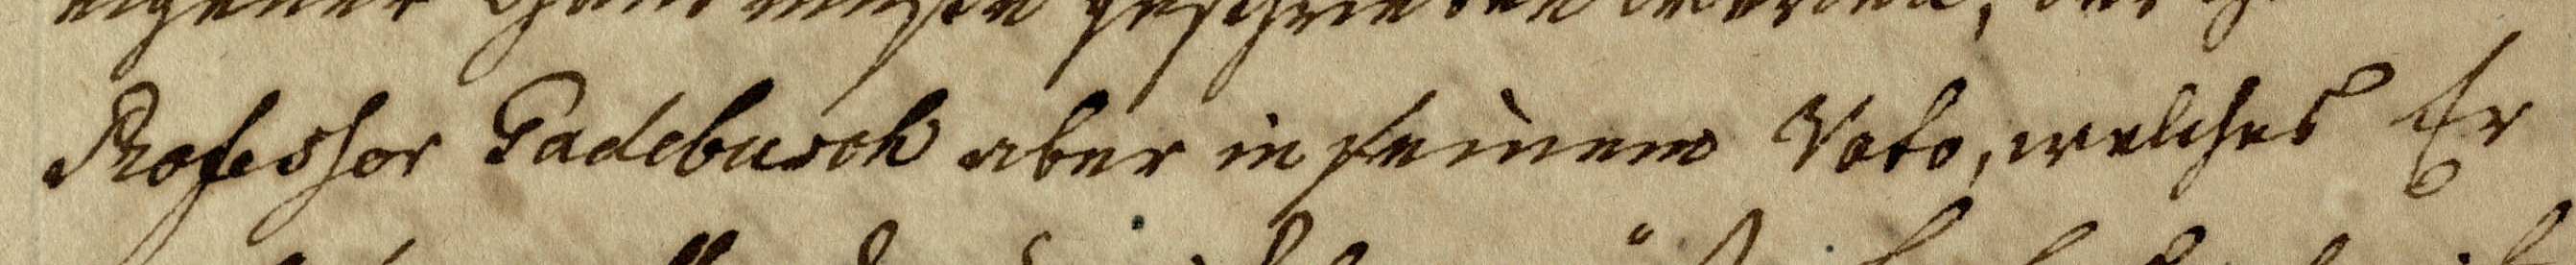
Professor Gadebusch aber in seinem Voto, welches Er
